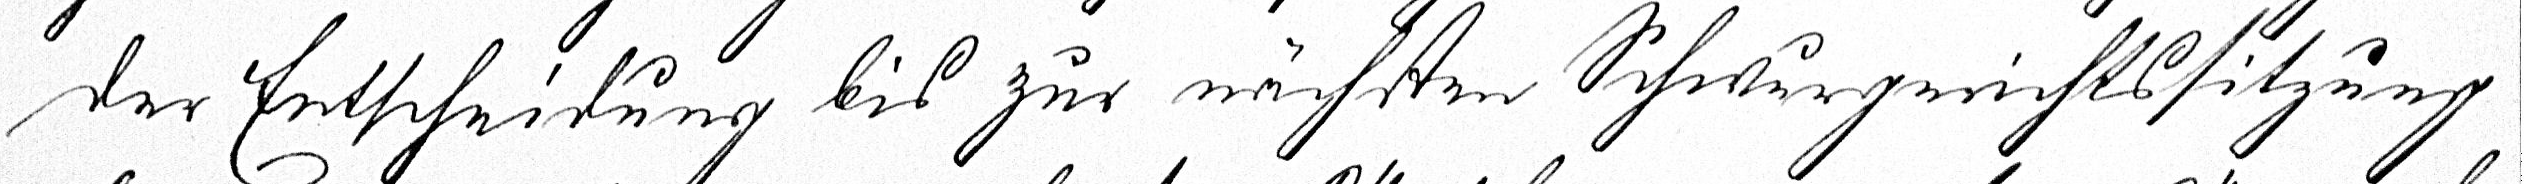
der Entscheidung bis zur nächsten Schwurgerichtssitzung
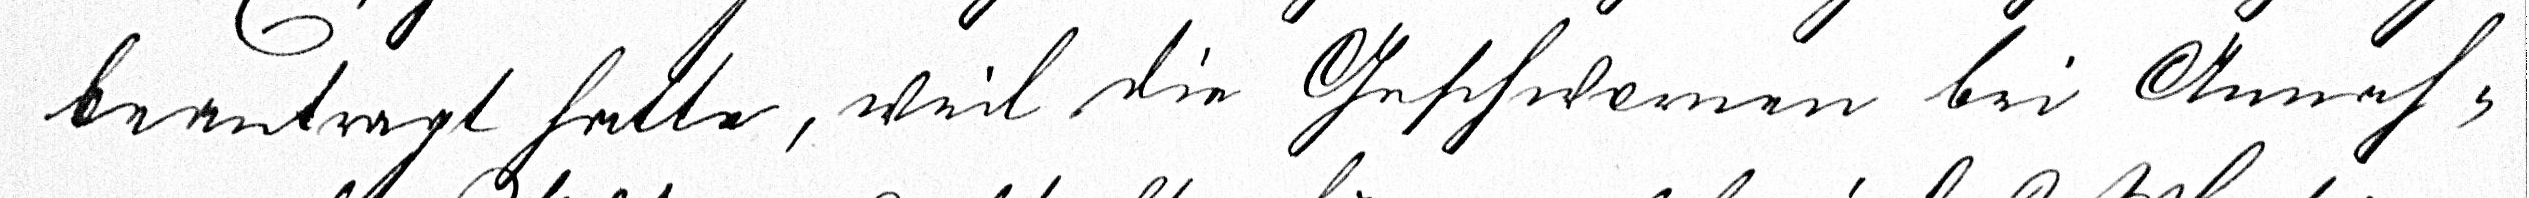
beantragt hatte, weil die Geschwornen bei Annah¬
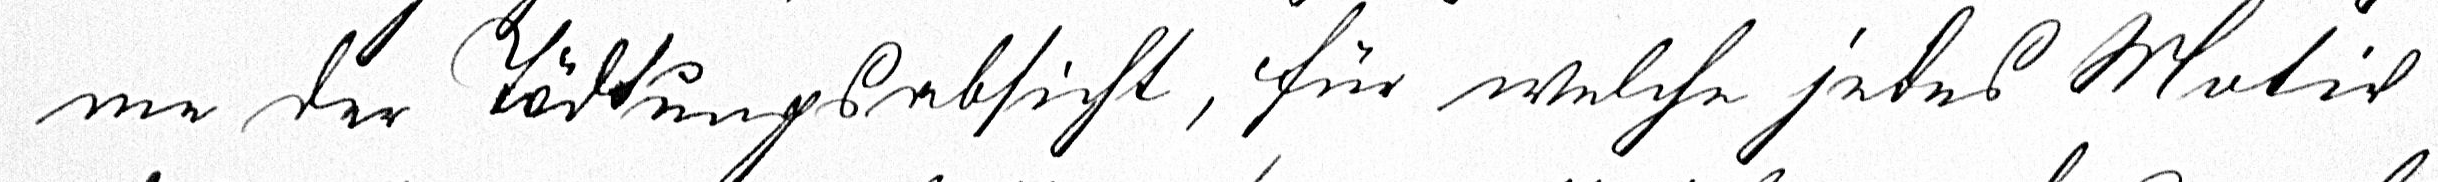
me der Tödtungsabsicht, für welche jedes Motiv
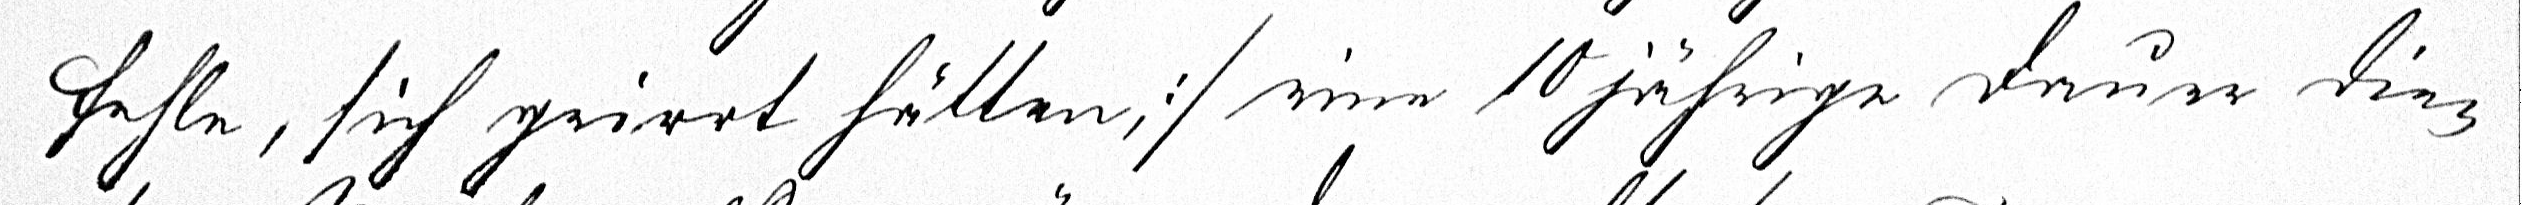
fehle, sich geirrt hätten,:/ eine 10 jährige Dauer die¬
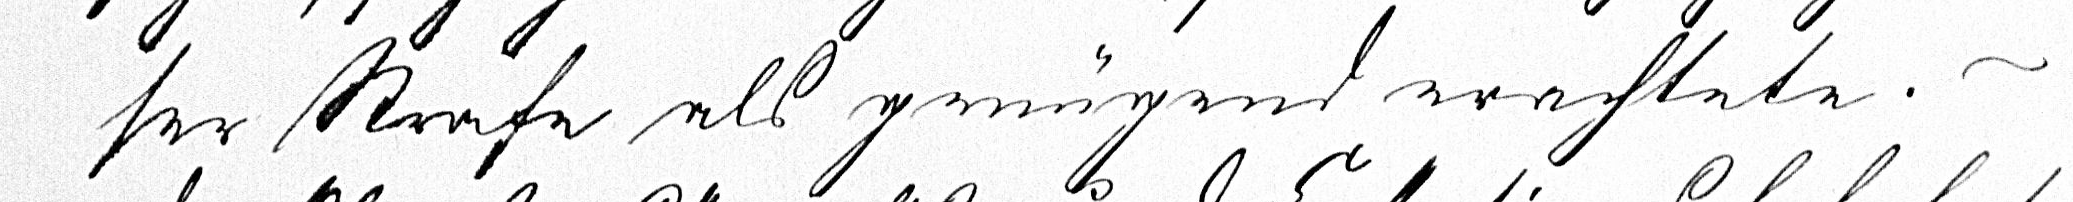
ser Strafe als genügend erachtete.
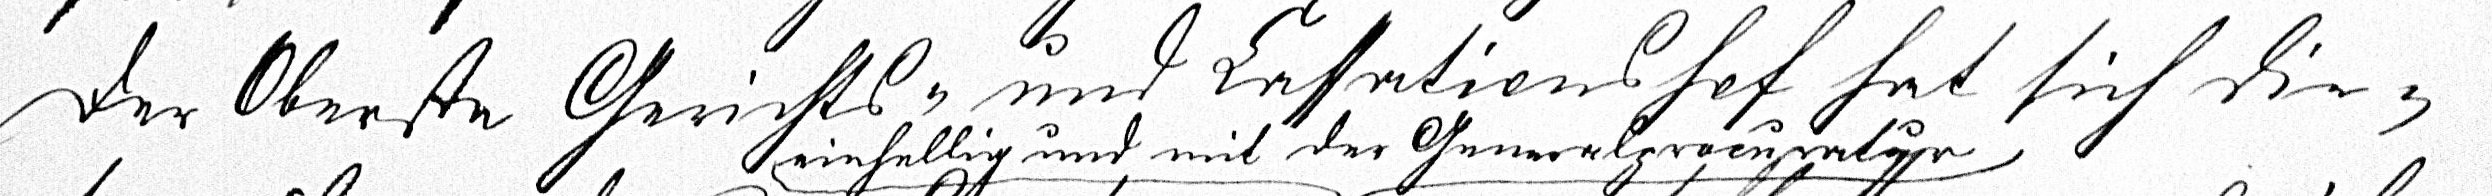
Der Oberste Gerichts- und Cassationshof hat sich die¬
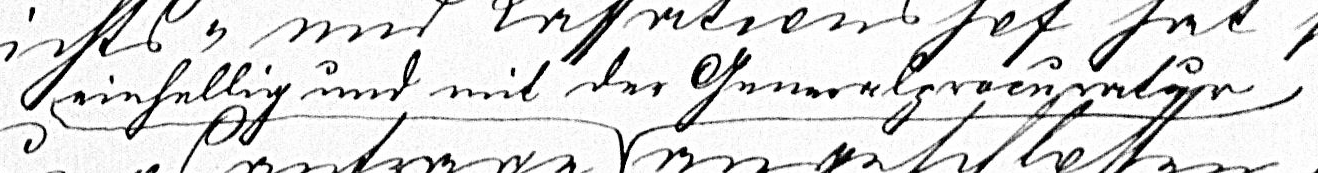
einhellig und mit der Generalprocuratur
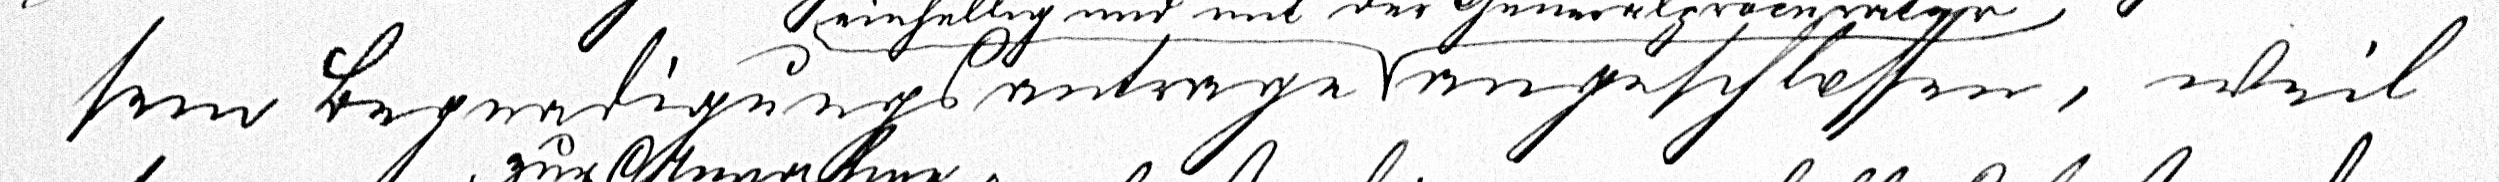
sem Begnadigungsantrage angeschlossen, weil
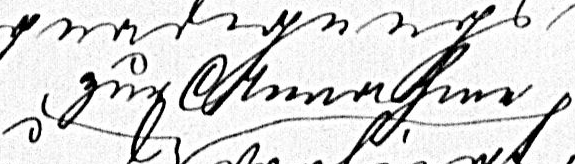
zur Annahme
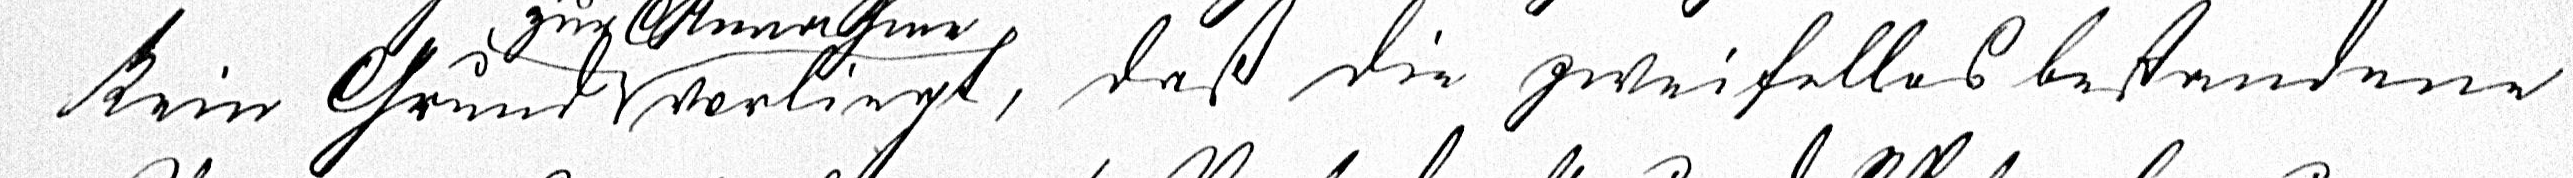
kein Grund vorliegt, daß die zweifelles bestandene
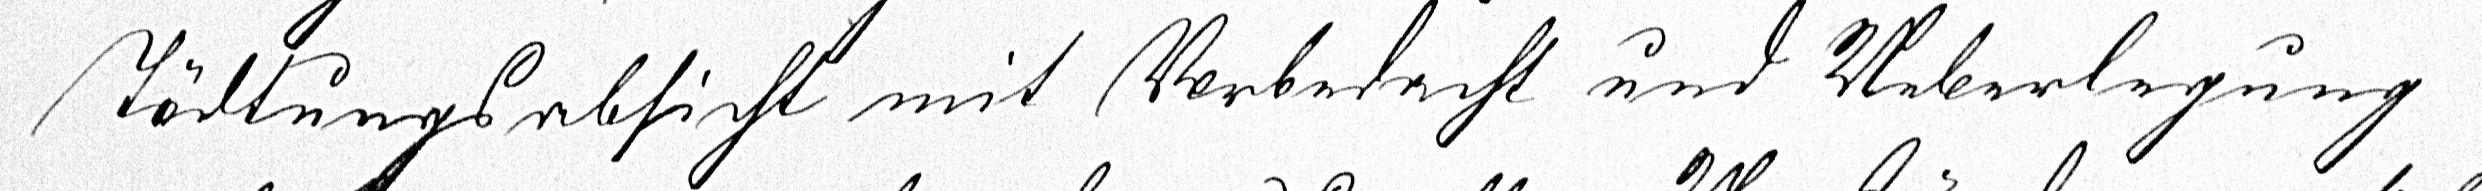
Tödtungsabsicht mit Vorbedacht und Ueberlegung
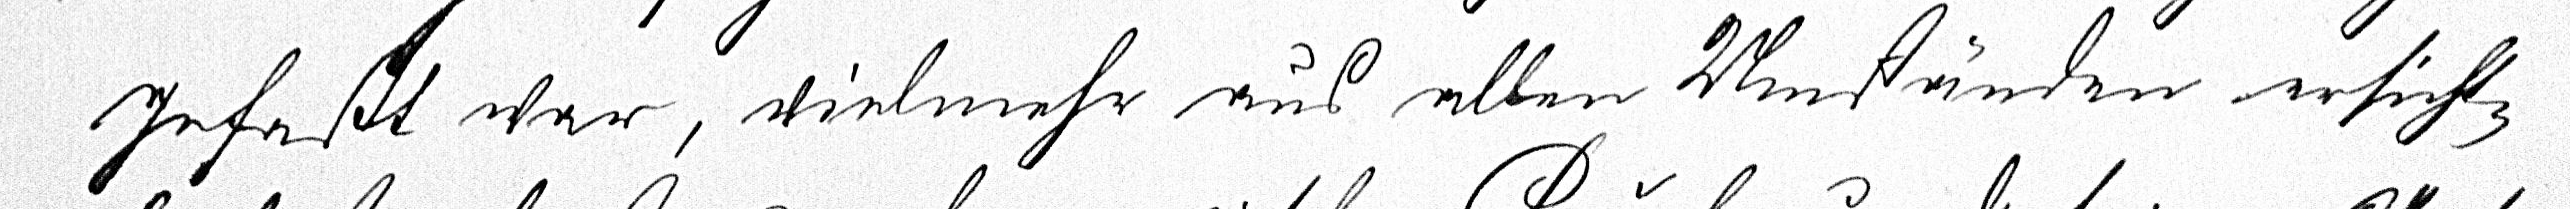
gefaßt war, vielmehr aus alten Umständen ersicht¬
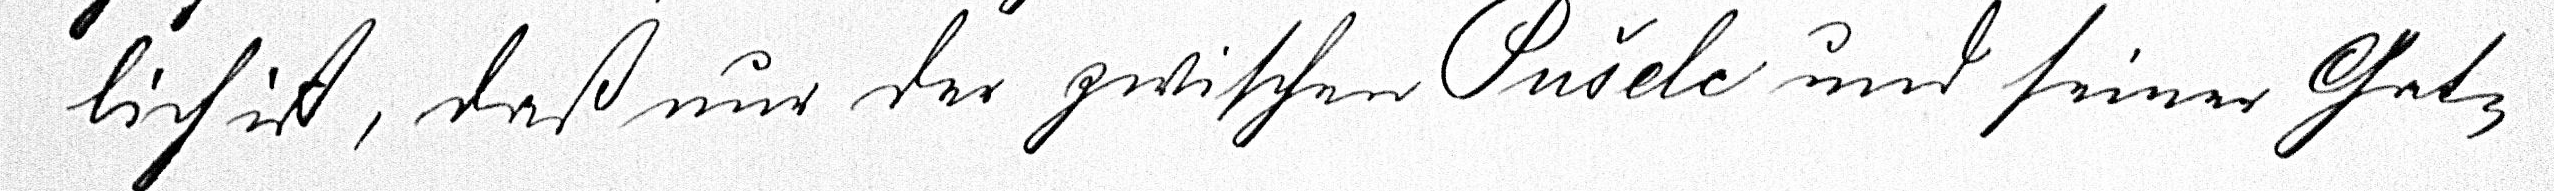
lich ist, daß nur der zwischen Pušelc und seiner Gat-
